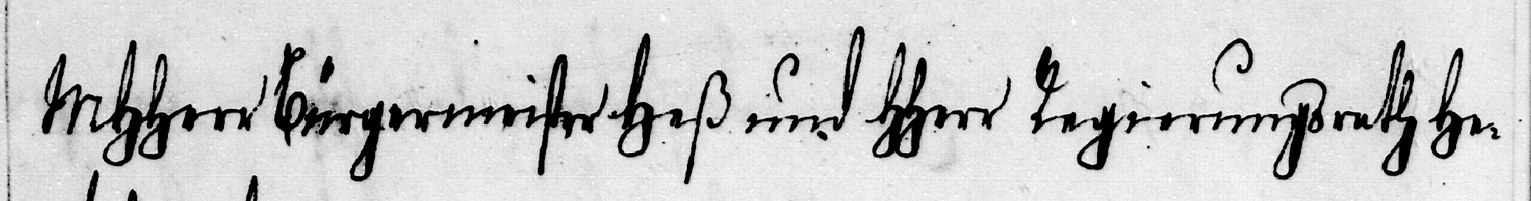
MHHerr Bürgermeister Heß und HHerr Regierungsrath He¬
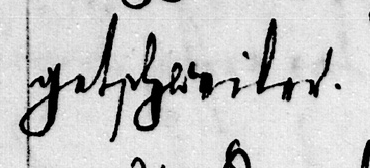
getschweiler.
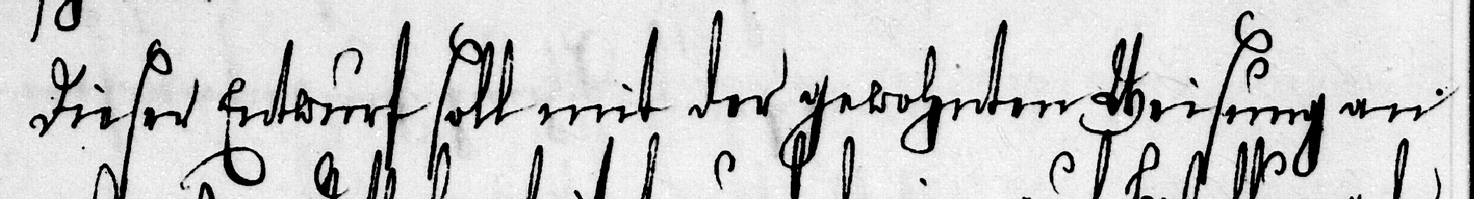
Dieser Entwurf soll mit der gewohnten Weisung an
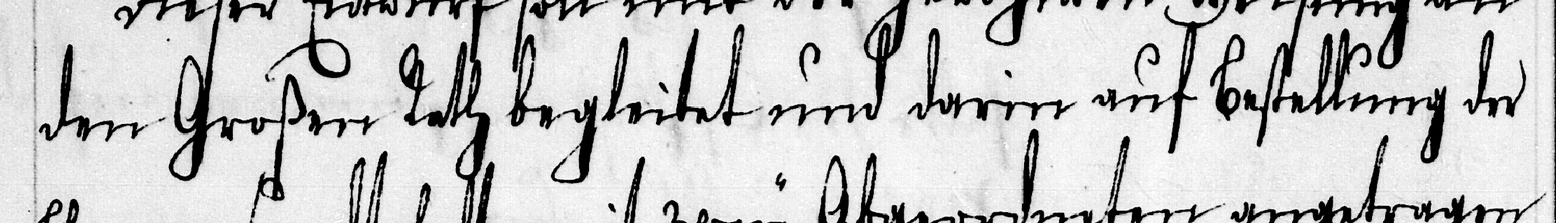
den Großen Rath begleitet und darin auf Bestellung der
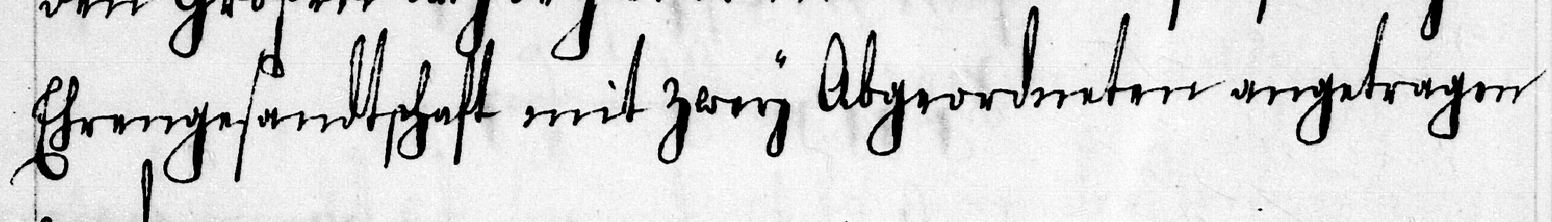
Ehrengesandtschaft mit zwey Abgeordneten angetragen
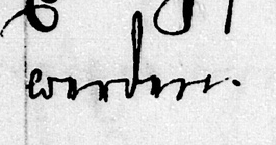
werden.
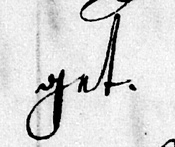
get.
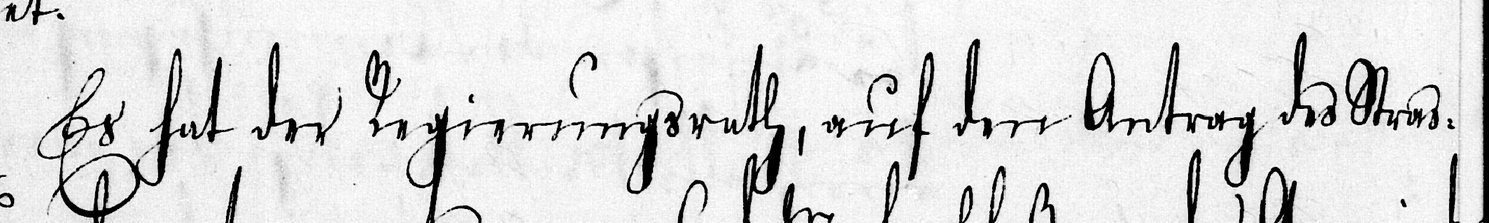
Es hat der Regierungsrath, auf den Antrag des Straß¬
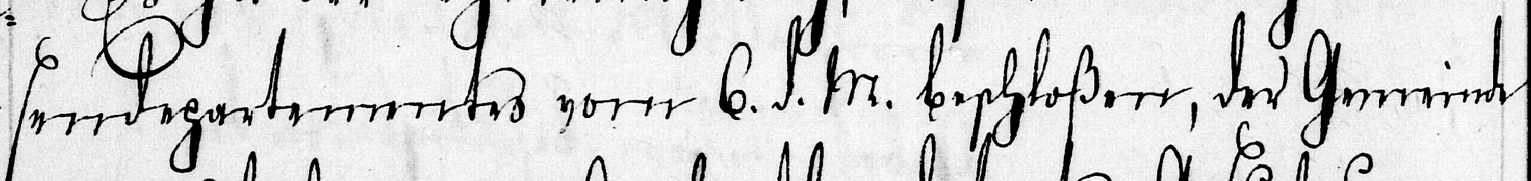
endepartementes vom 6. d. M. beschloßen, der Gemeinde
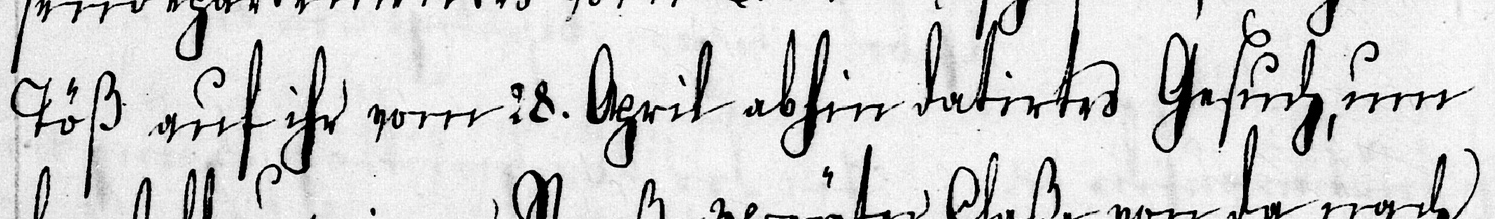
Töß auf ihr vom 28. April abhin datirtes Gesuch, um
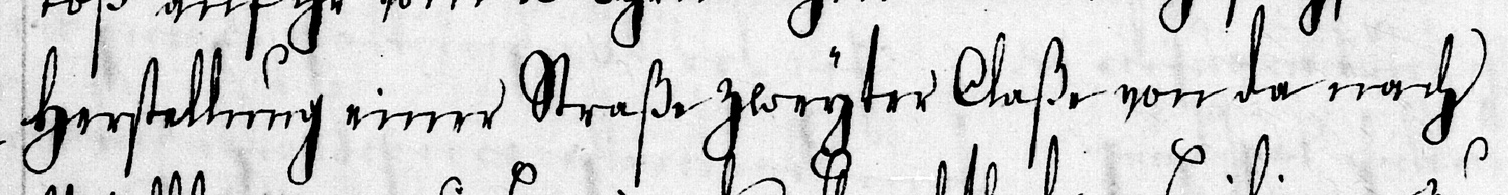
Herstellung einer Straße zweyter Claße von da nach
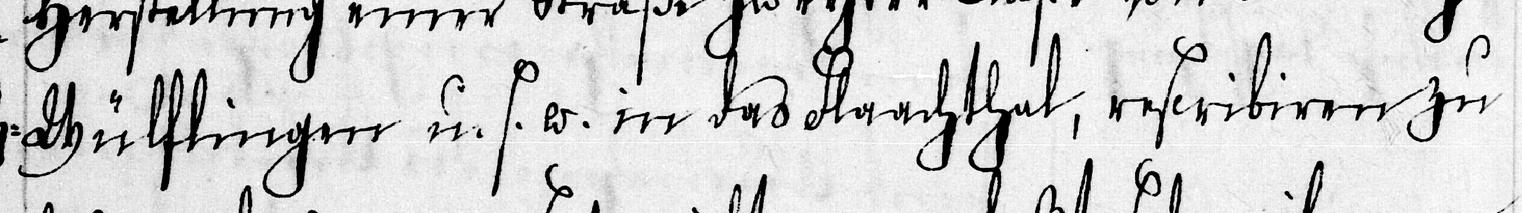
Wülflingen u. s. w. in das Flaachthal, rescribiren zu
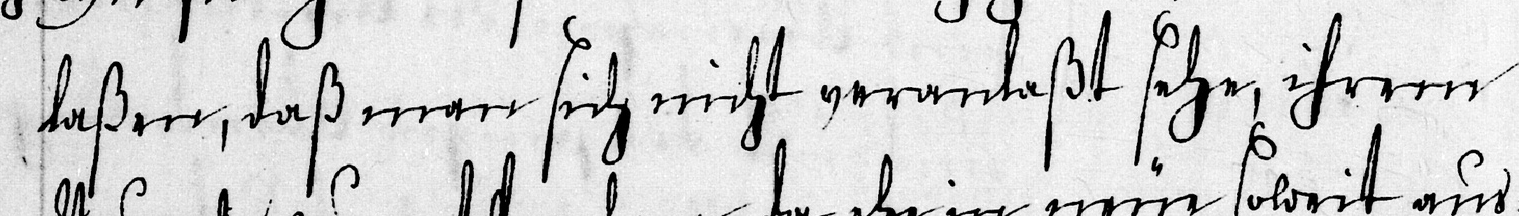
laßen, daß man sich nicht veranlaßt sehe, ihrem
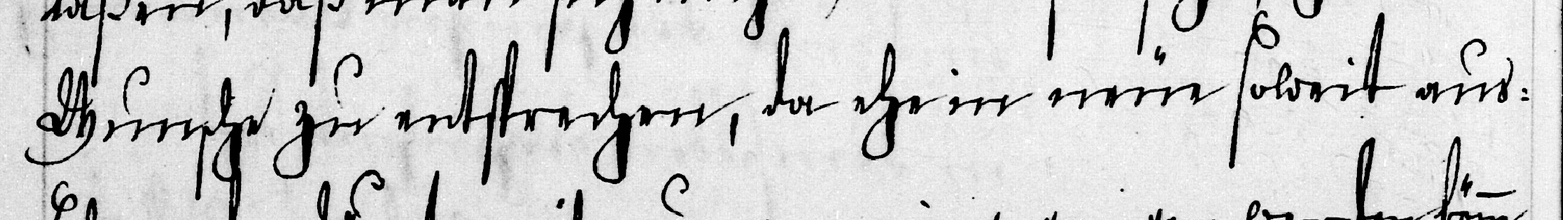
Wunsche zu entsprechen, da ehe in neue soweit aus¬
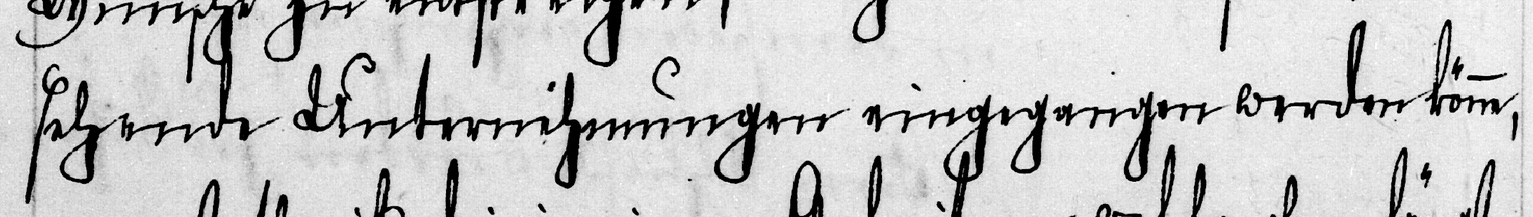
sehende Unternehmungen eingegangen werden könne,
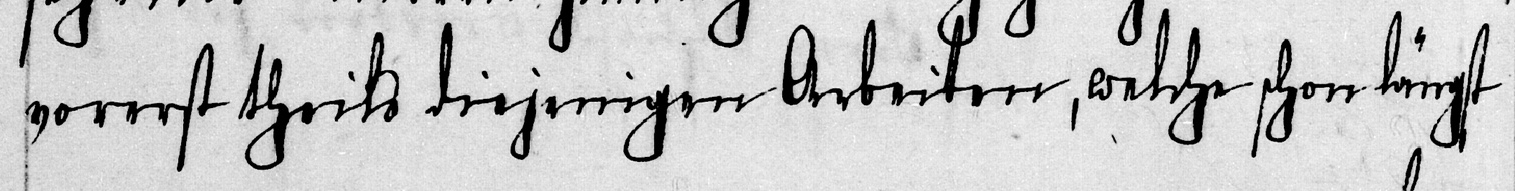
vorerst theils diejenigen Arbeiten, welche schon längst
